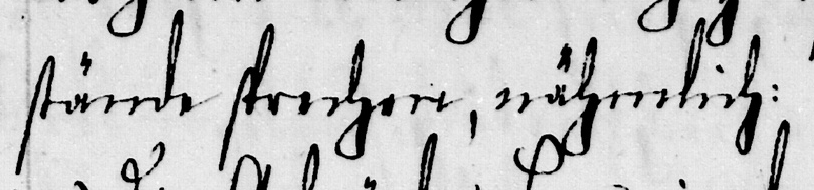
stände sprechen, nähmlich:
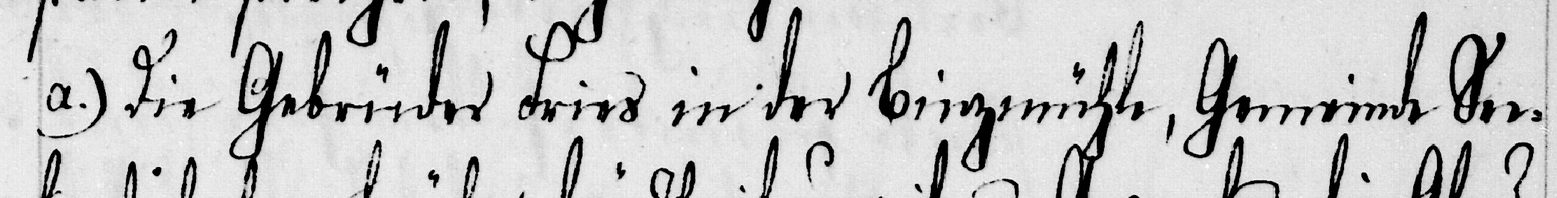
a.) Die Gebrüder Fries in der Binzmühle, Gemeinde Se¬
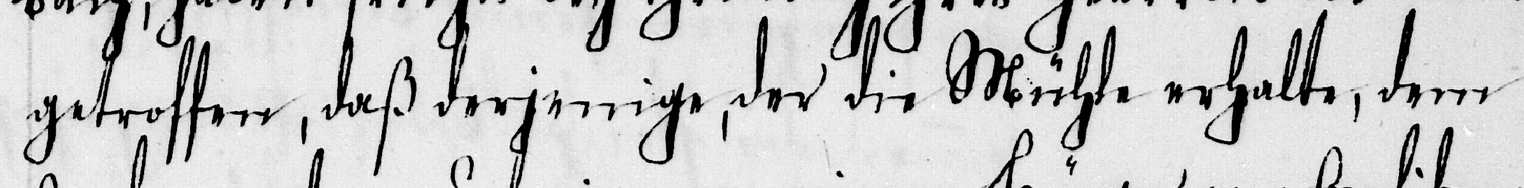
getroffen, daß derjenige, der die Mühle erhalte, dem
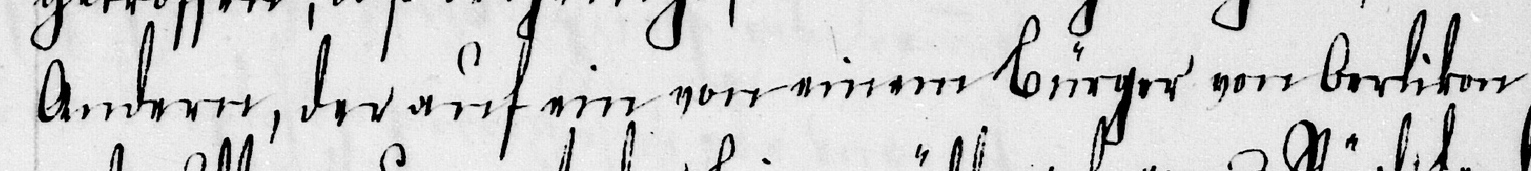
Andern, der auf ein von einem Bürger von Oerlikon
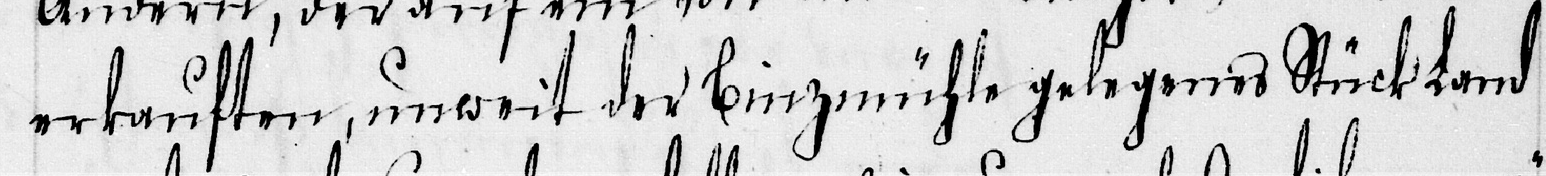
erkauften, unweit der Binzmühle gelegenes Stück Land
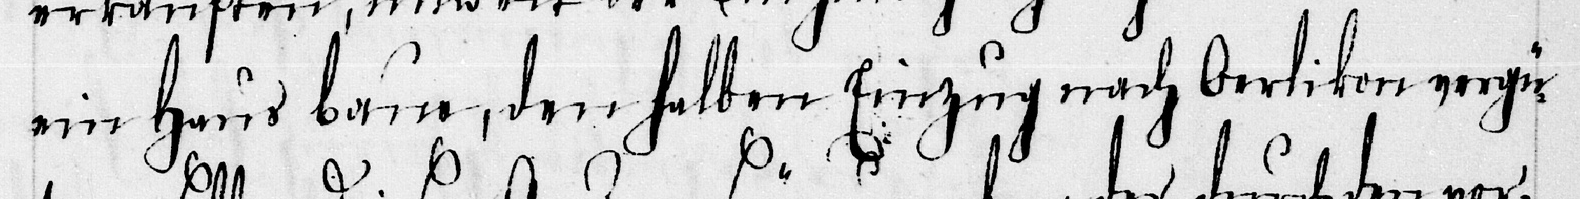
ein Haus baue, den halben Einzug nach Oerlikon vergü¬
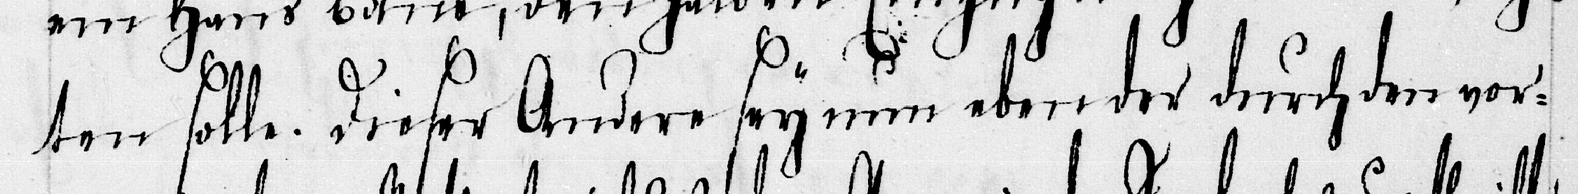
ten solle. Dieser Andere sey nun aber der durch den vor¬
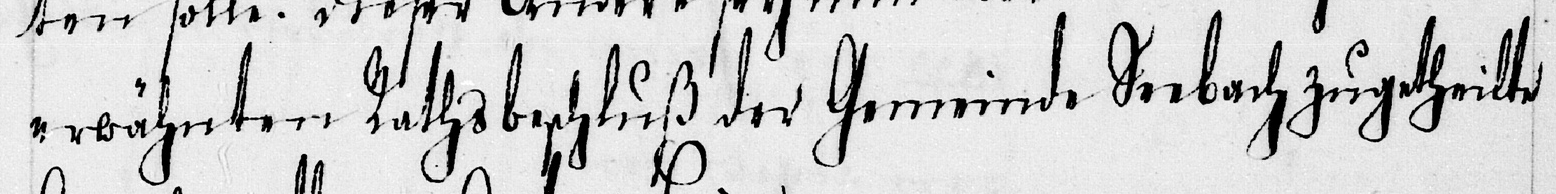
erwähnten Rathsbeschluß der Gemeinde Seebach zugetheilte
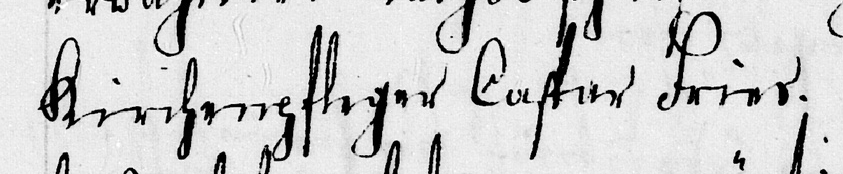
Kirchenpfleger Caspar Fries.
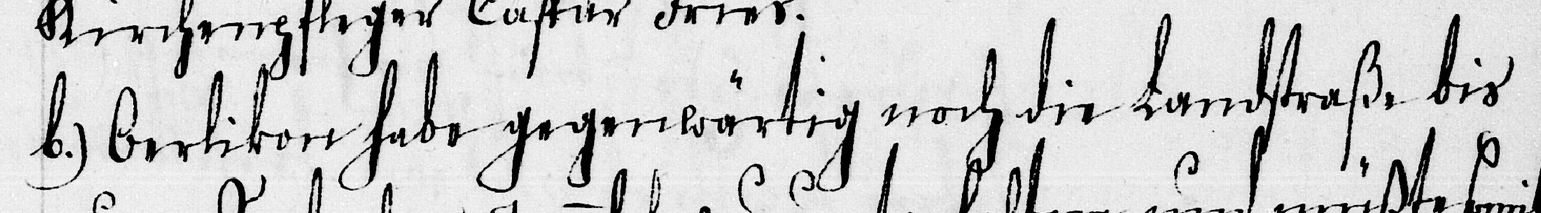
b.) Oerlikon habe gegenwärtig noch die Landstraße bis
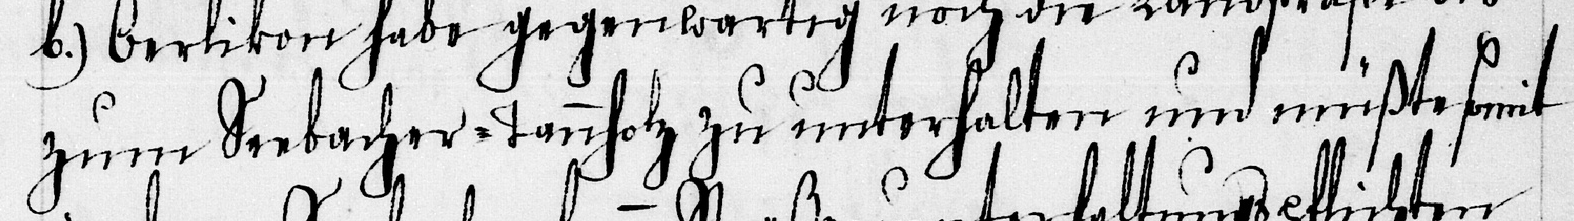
zum Seebacher-Tannholz zu unterhalten und müßte somit
